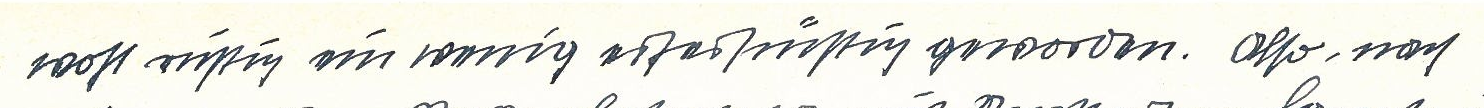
wohl richtig ein wenig eifersüchtig geworden. Also, nach
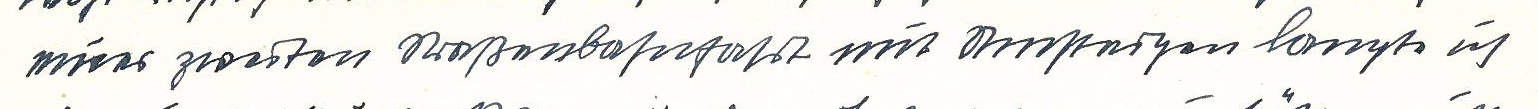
einer zweiten Straßenbahnfahrt mit Umsteigen langte ich
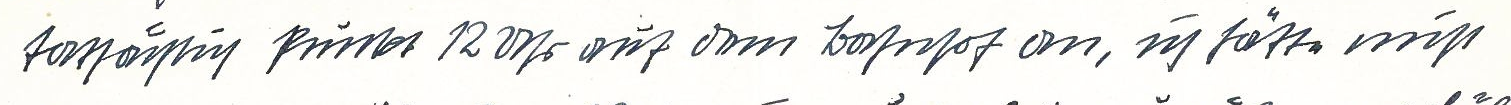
tatsächlich Punkt 12 Uhr auf dem Bahnhof an, ich hätte nicht
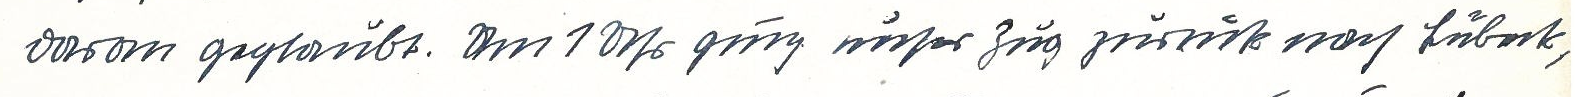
daran geglaubt. Um 1 Uhr ging unser Zug zurück nach Lübeck,
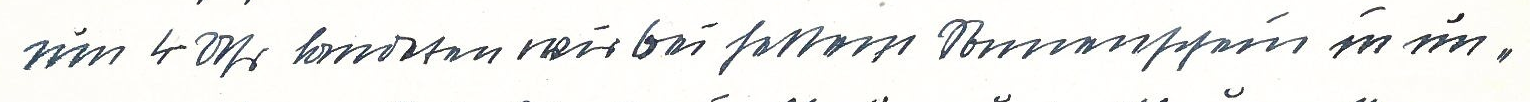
um 4 Uhr landeten wir bei hellem Sonnenschein in un¬
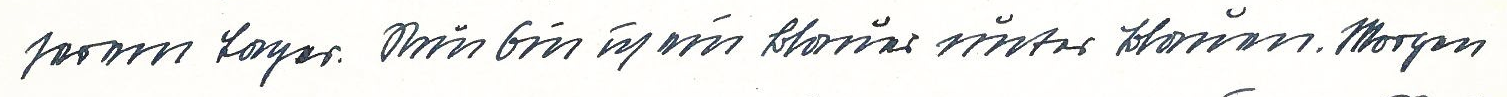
serem Lager. Nun bin ich ein Blauer unter Blauen. Morgen
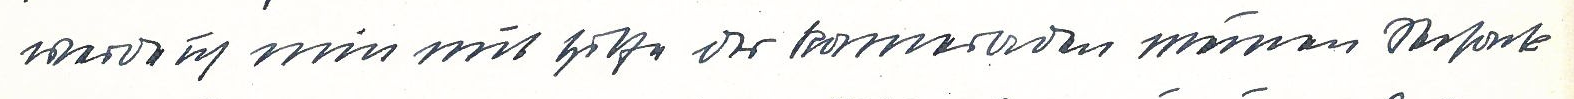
werde ich nun mit Hilfe der Kameraden meinen Seesack
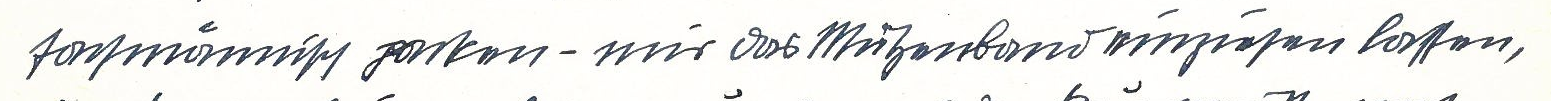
fachmännisch packen – mir das Mützenband einziehen lassen,
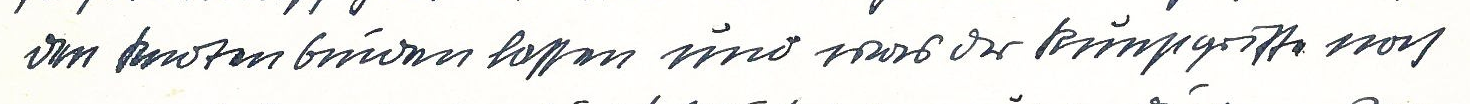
den Knoten binden lassen und was der Kunstgriffe noch
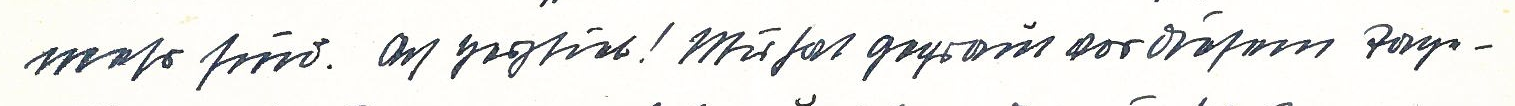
mehr sind. Ach Herzlieb! Mir hat gegraut vor diesem Tage –
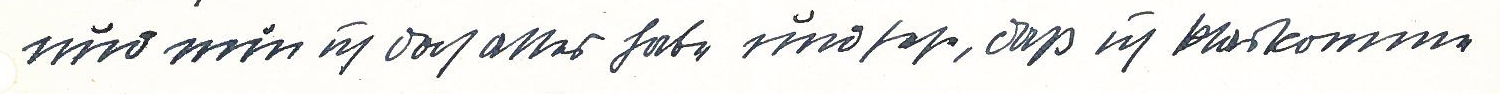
und nun ich doch alles habe und sehe, daß ich klarkomme
